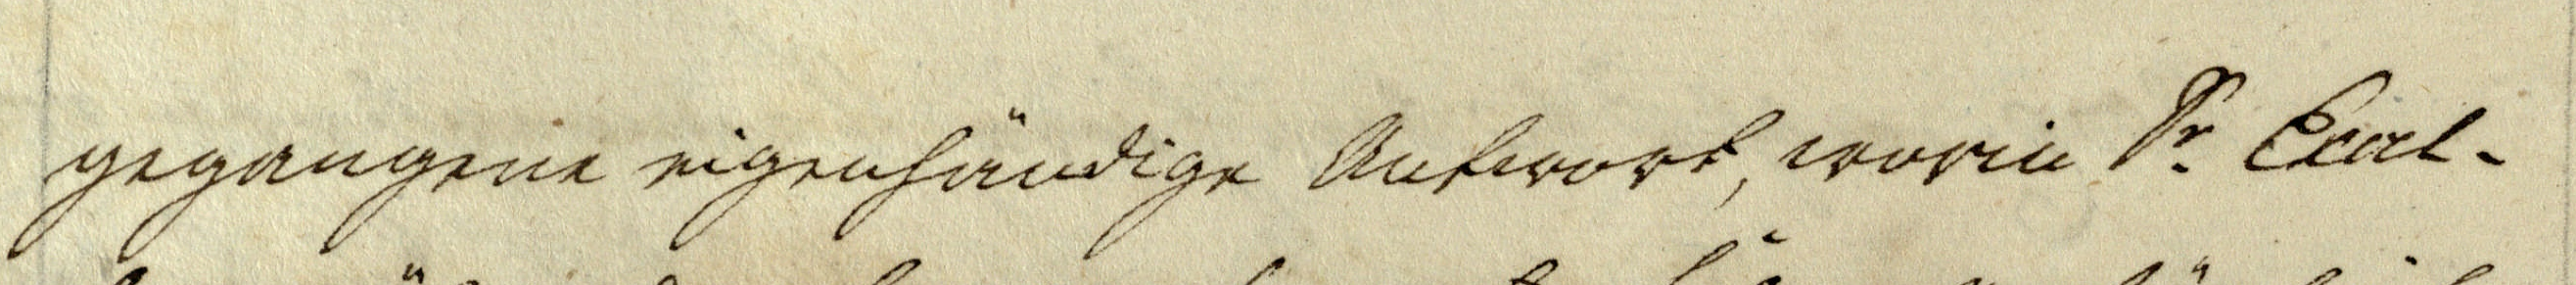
gegangene eigenhändige Antwort, worin Sr Excel¬
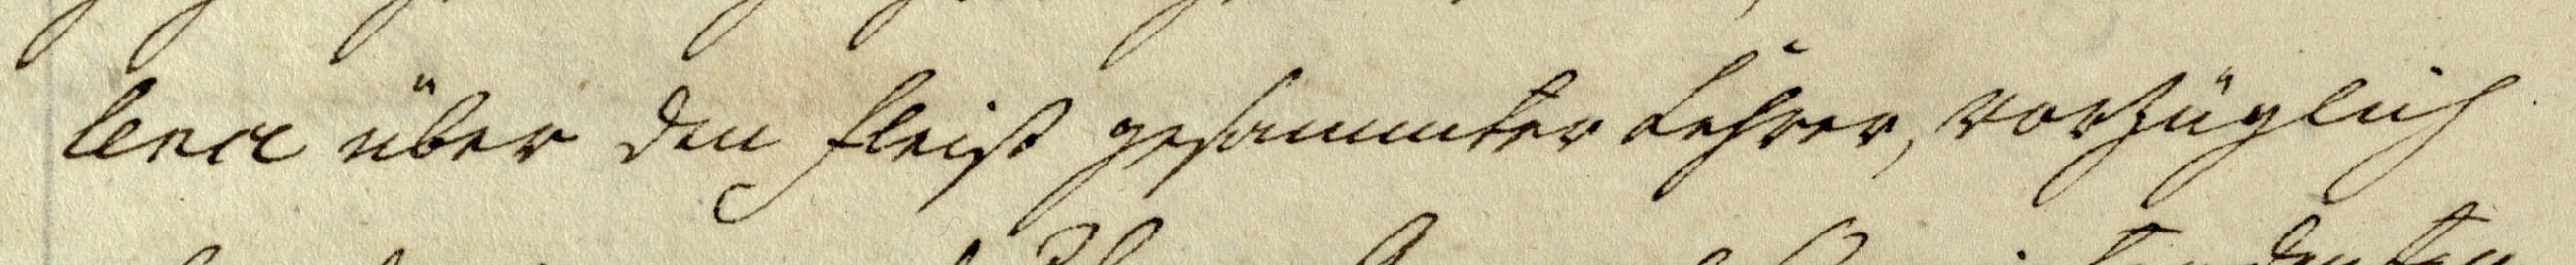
lence über den Fleiß gesammter Lehrer, vorzüglich
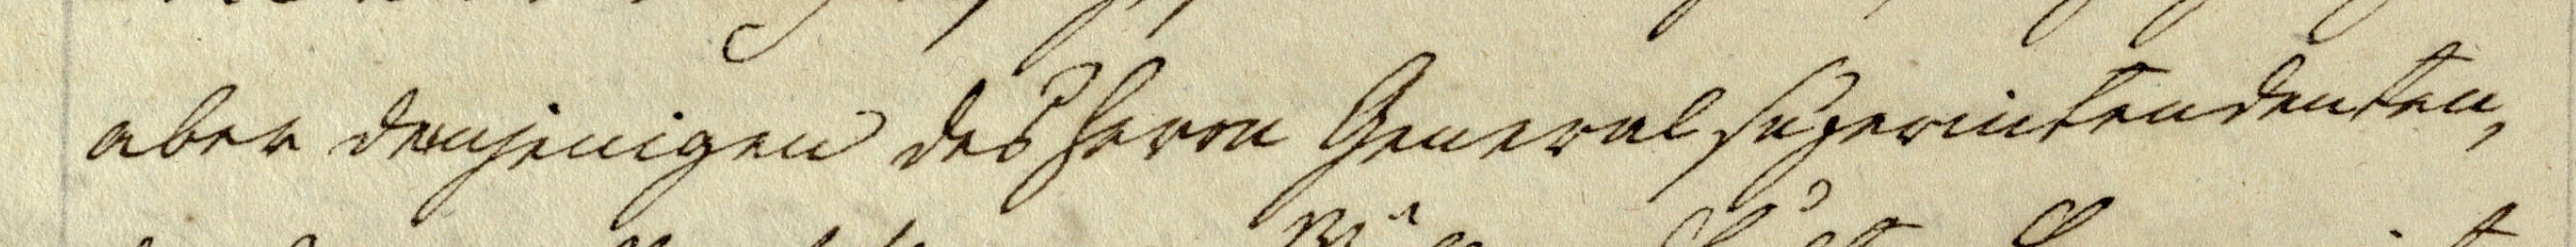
aber demjenigen des Herrn Generalsuperintendenten,
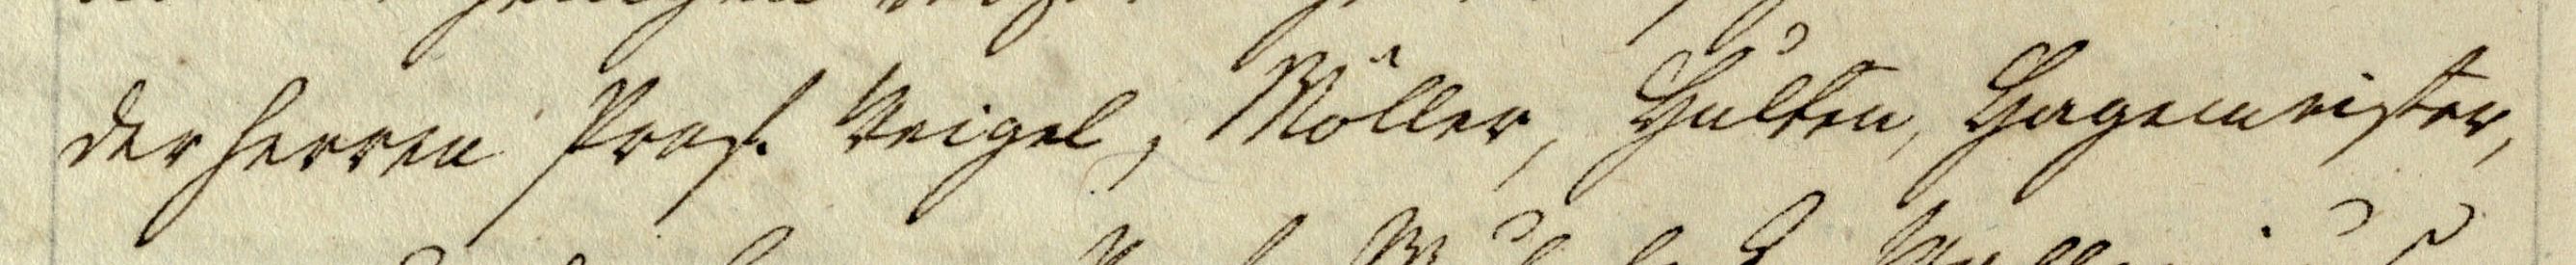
der Herren Prof. Weigel, Möller, Hulten, Hagemeister,
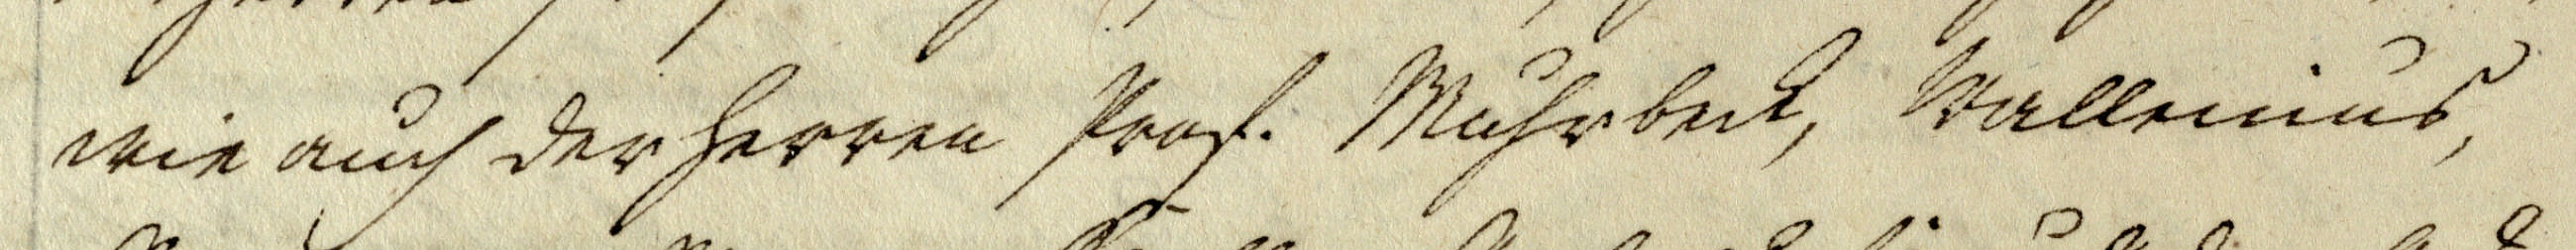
wie auch der Herren Prof. Muhrbeck, Wallenius,
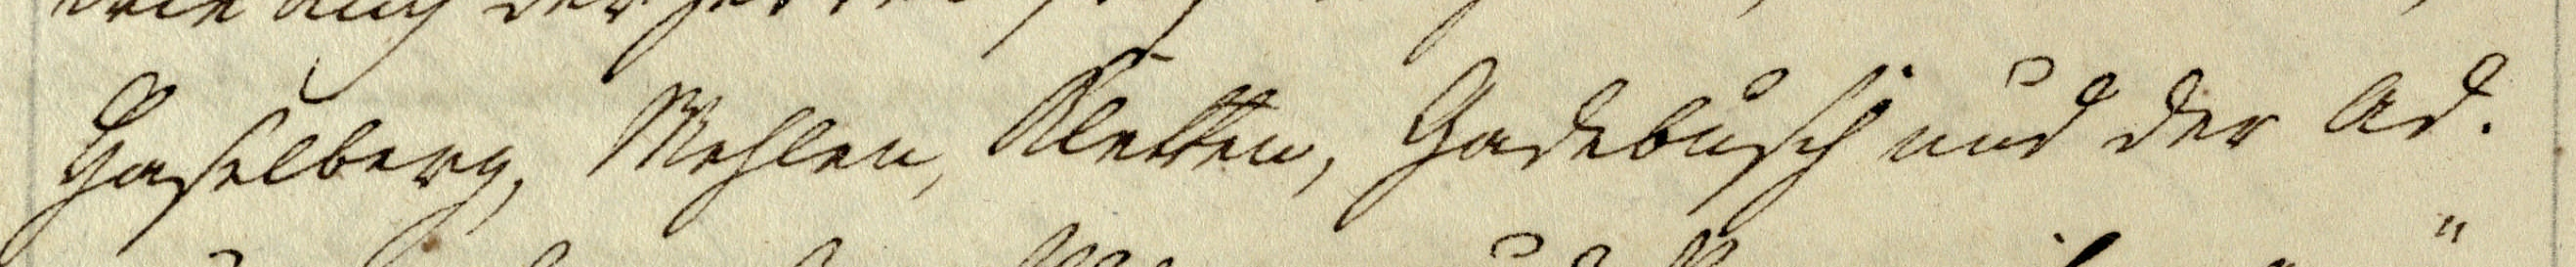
Haselberg, Mehlen, Kletten, Gadebusch und der Ad¬
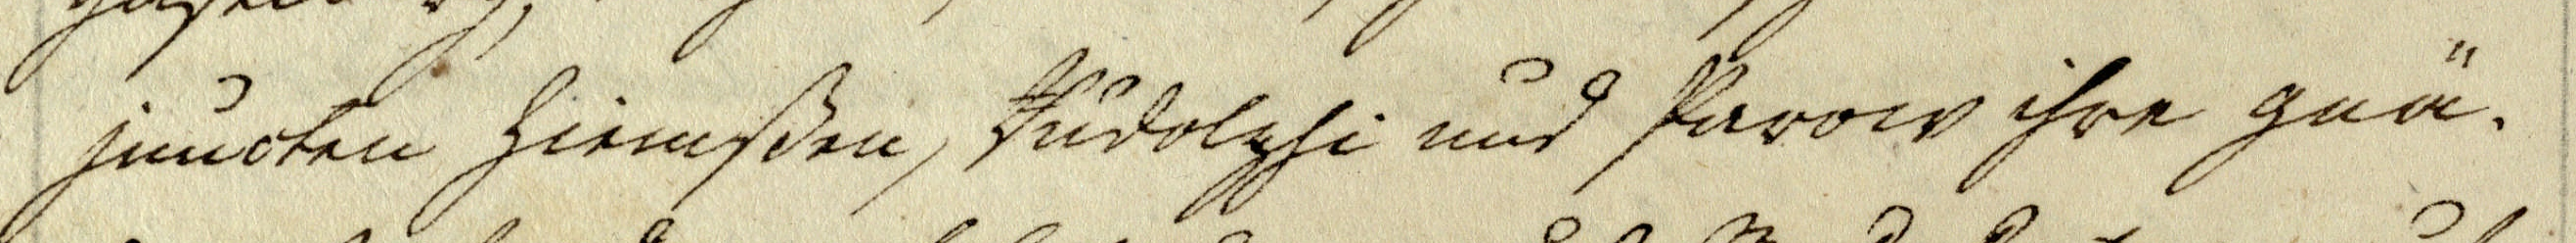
juncten Ziemßen, Rudolphi und Parow ihre gnä¬
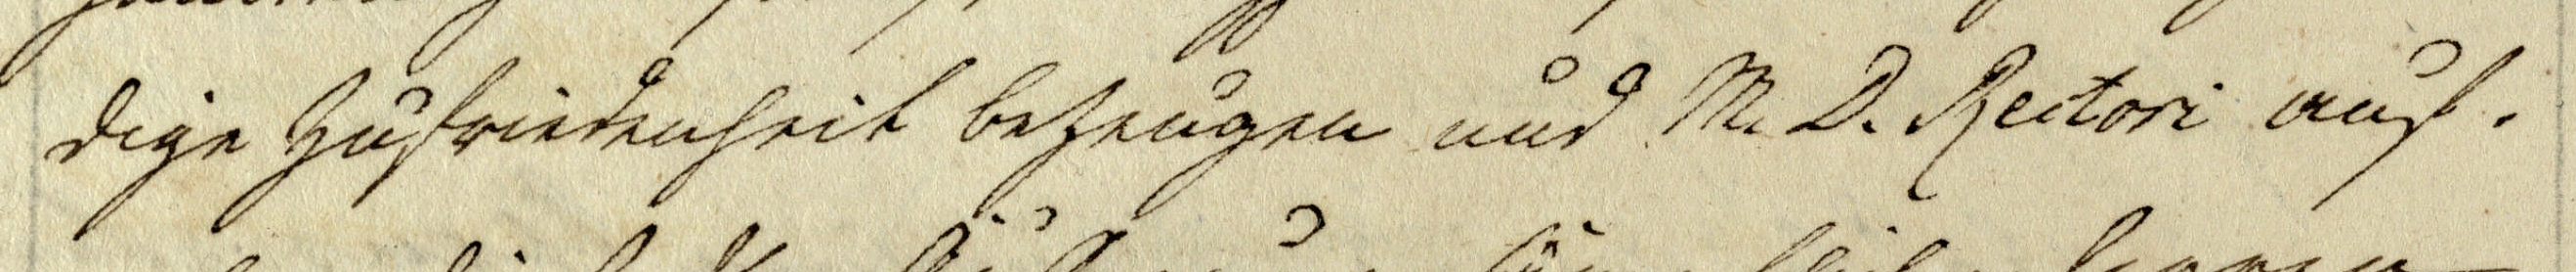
dige Zufriedenheit bezeugen und M. D. Rectori auf¬
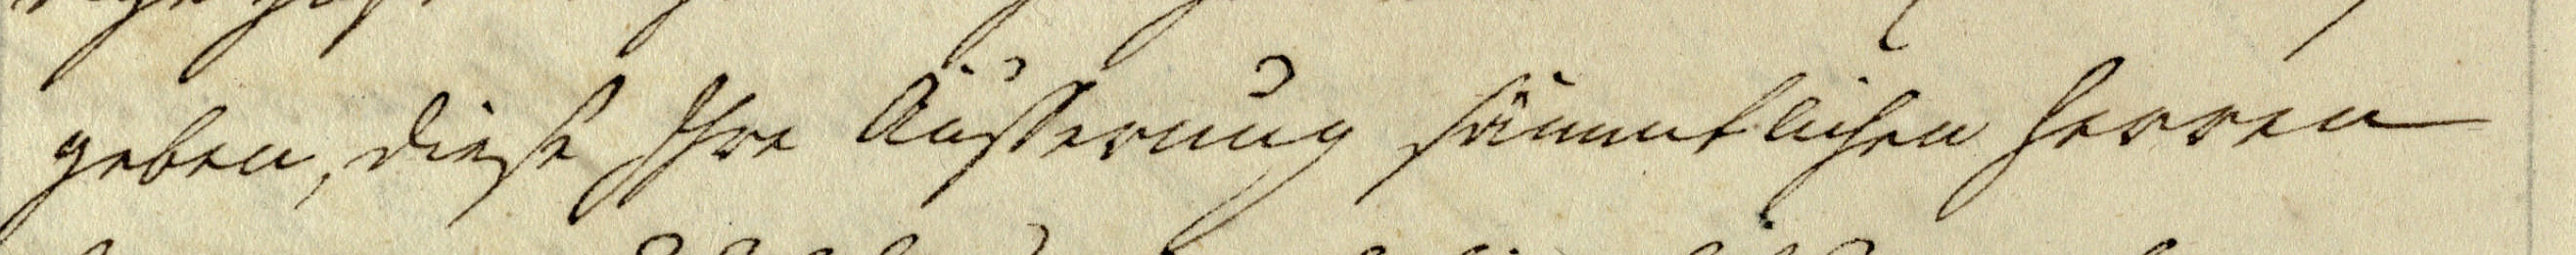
geben, diese Ihre Äusserung sämmtlichen Herren
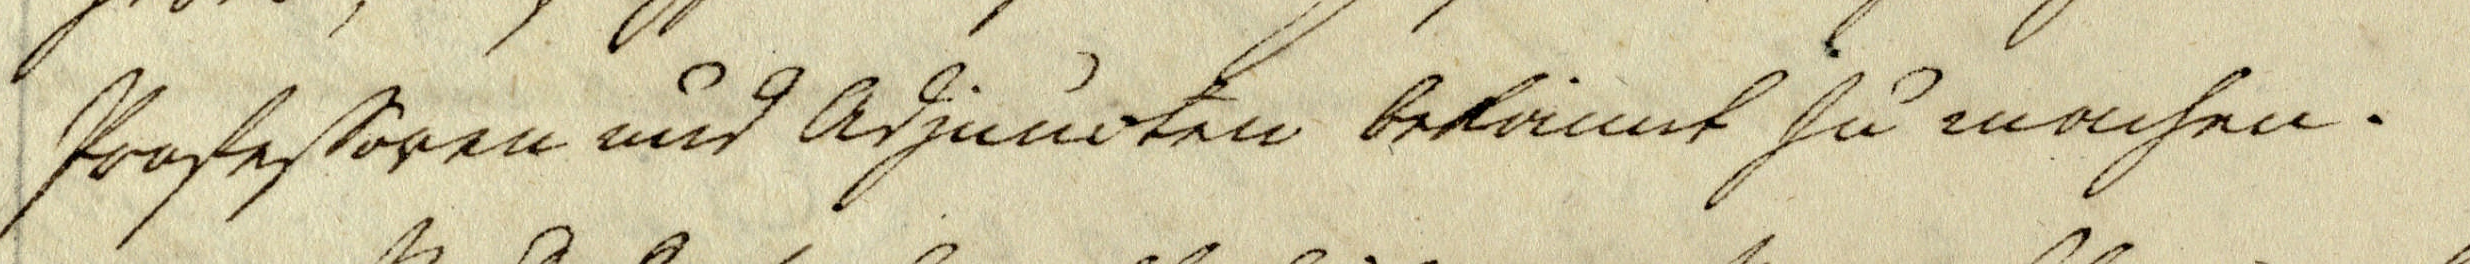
Professoren und Adjuncten bekannt zu machen.
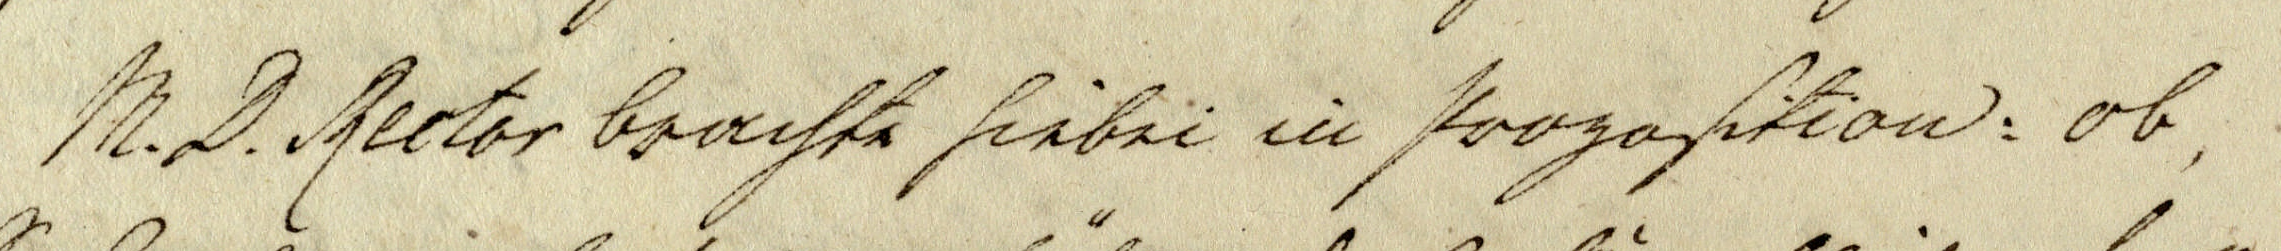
M. D. Rector brachte hiebei in Proposition: ob,
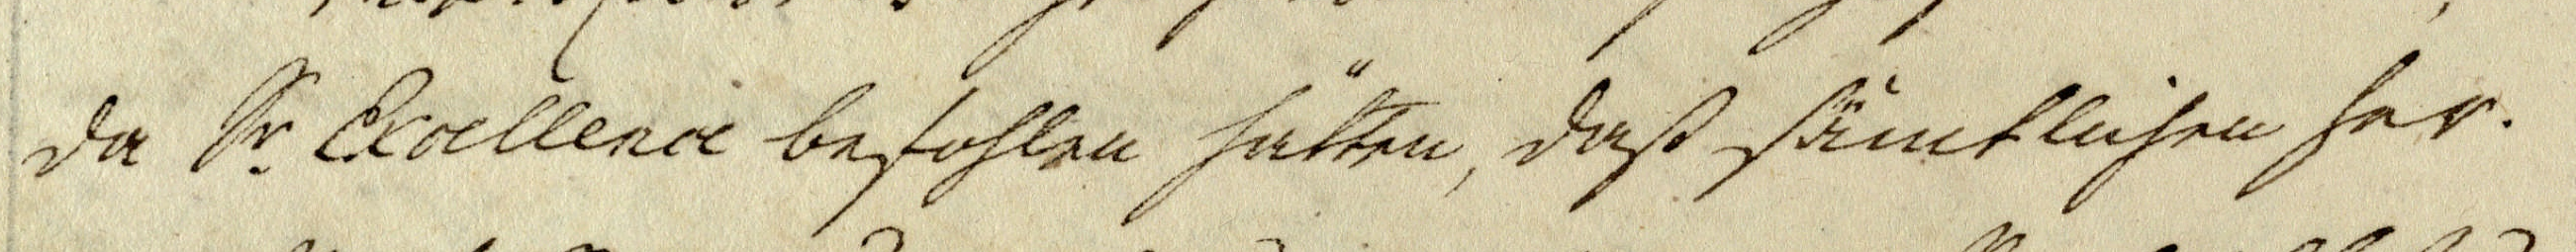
da Sr Excellence befohlen hätten, daß sämtlichen Her¬
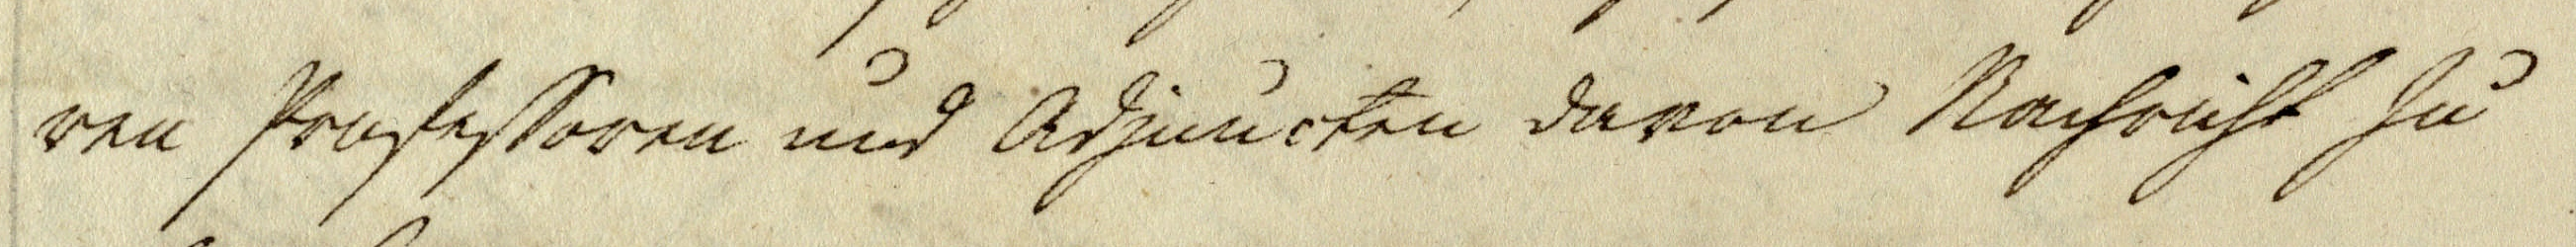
ren Professoren und Adjuncten davon Nachricht zu
